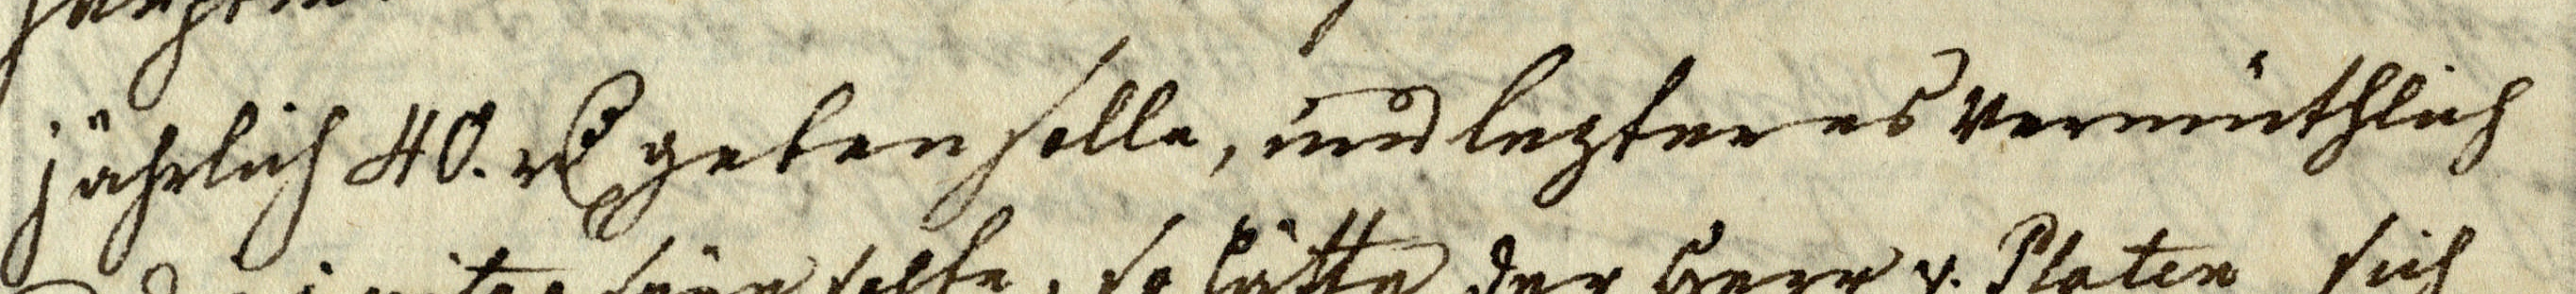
jährlich 40. rl. geben solle, und lezteres vermuthlich
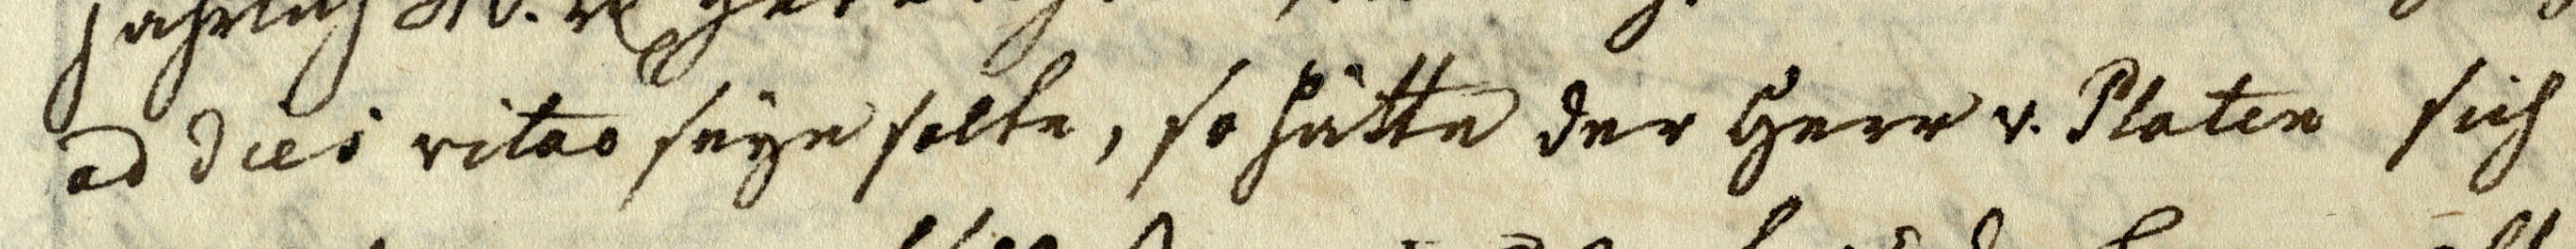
ad dies vitae seÿn solte, so hätte der Herr v. Platen sich
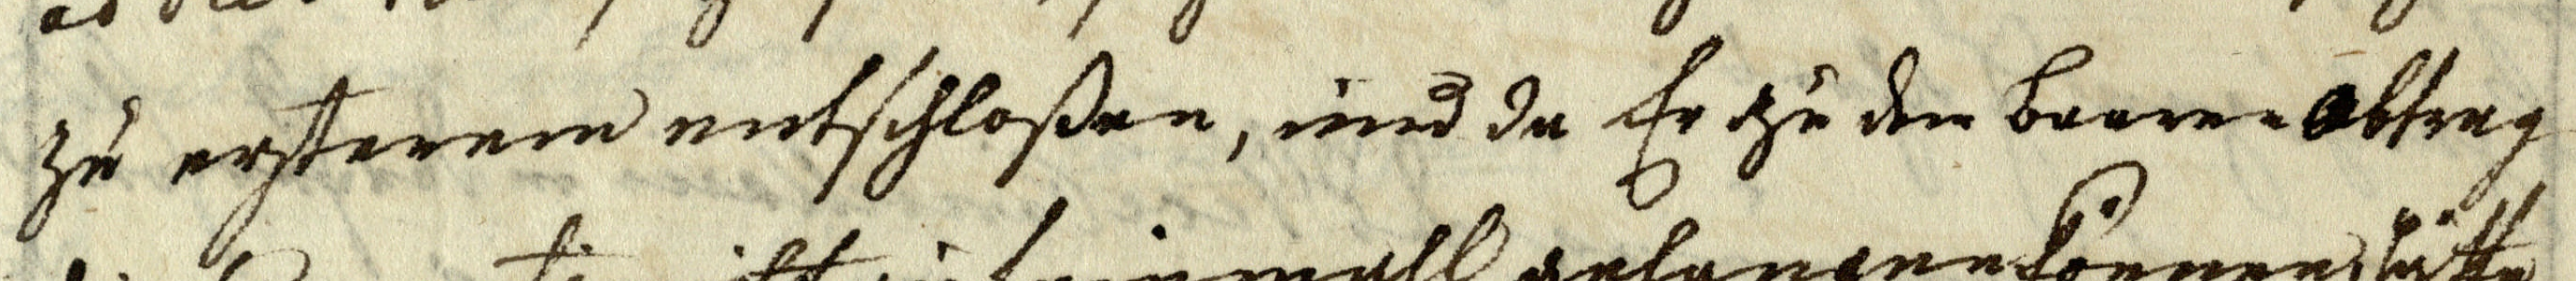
zu ersterem entschloßen, und da Er zu dem Baaren Abtrag
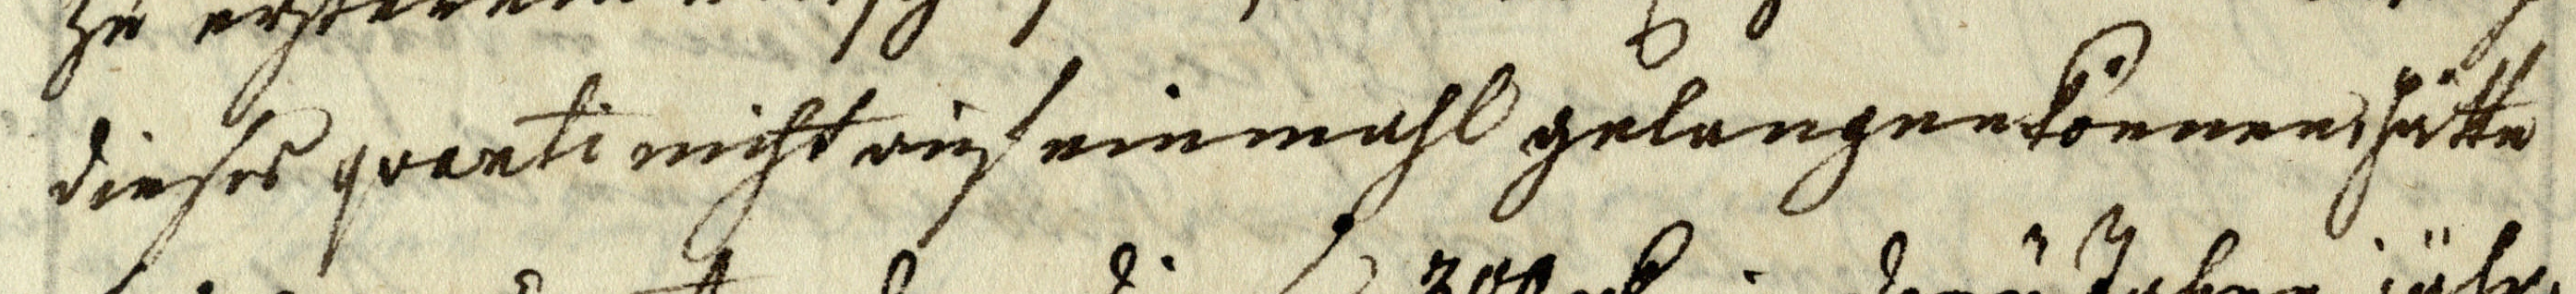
dieses quanti nicht auf einmahl gelangen können hätte
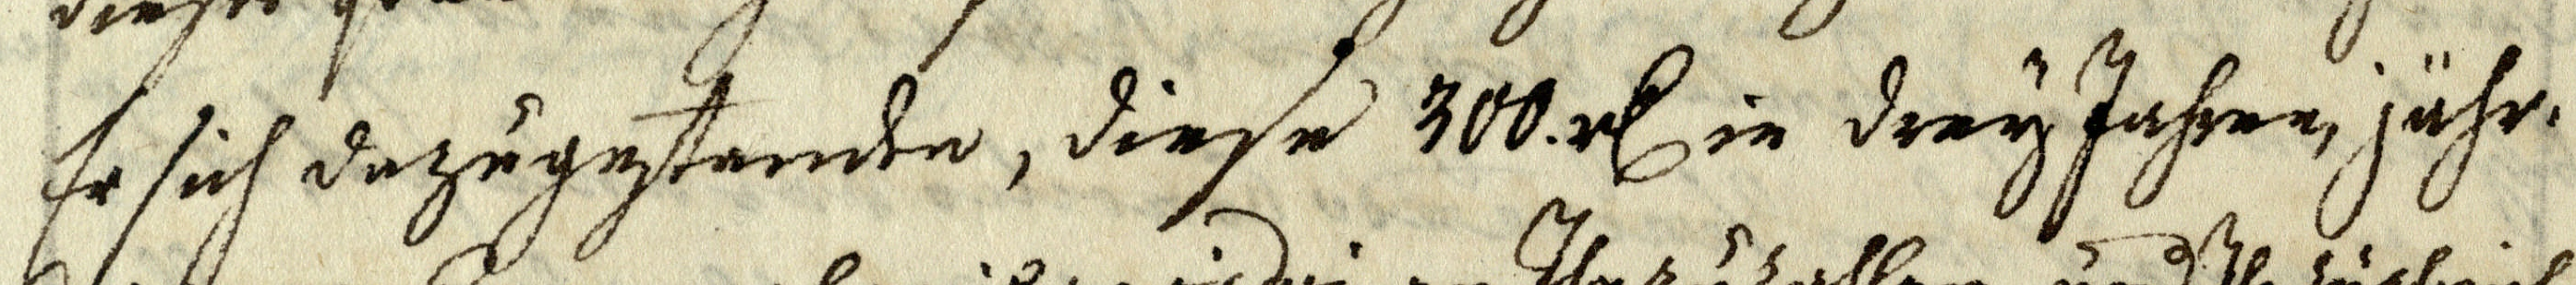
Er sich dazu gestanden, diese 300. rl in dreÿ Jahren, jähr¬
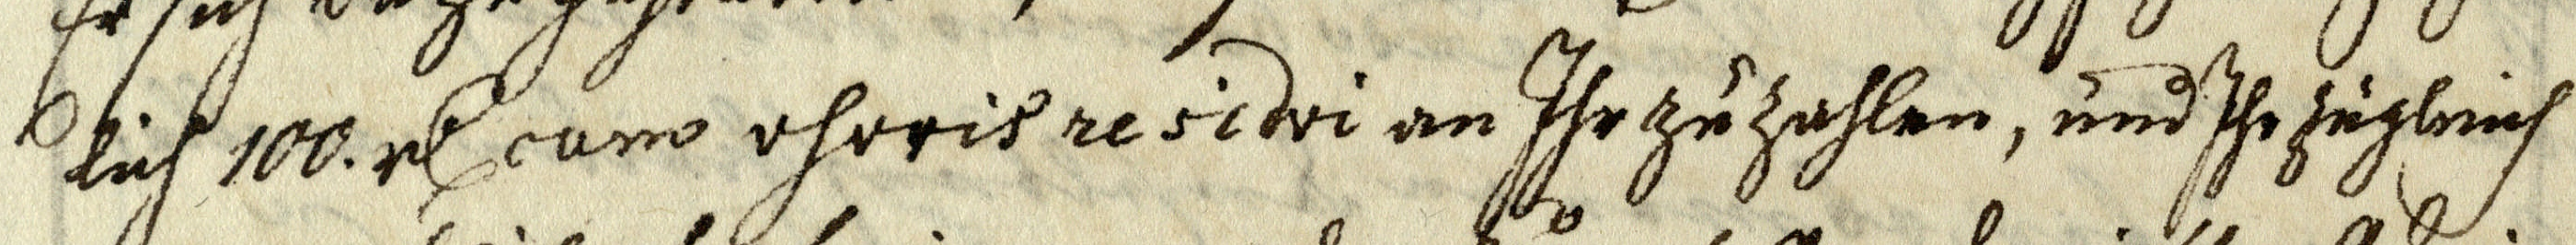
lich 100. rl cum vsvris residvi an Ihr zu zahlen, und Ihr zugleich
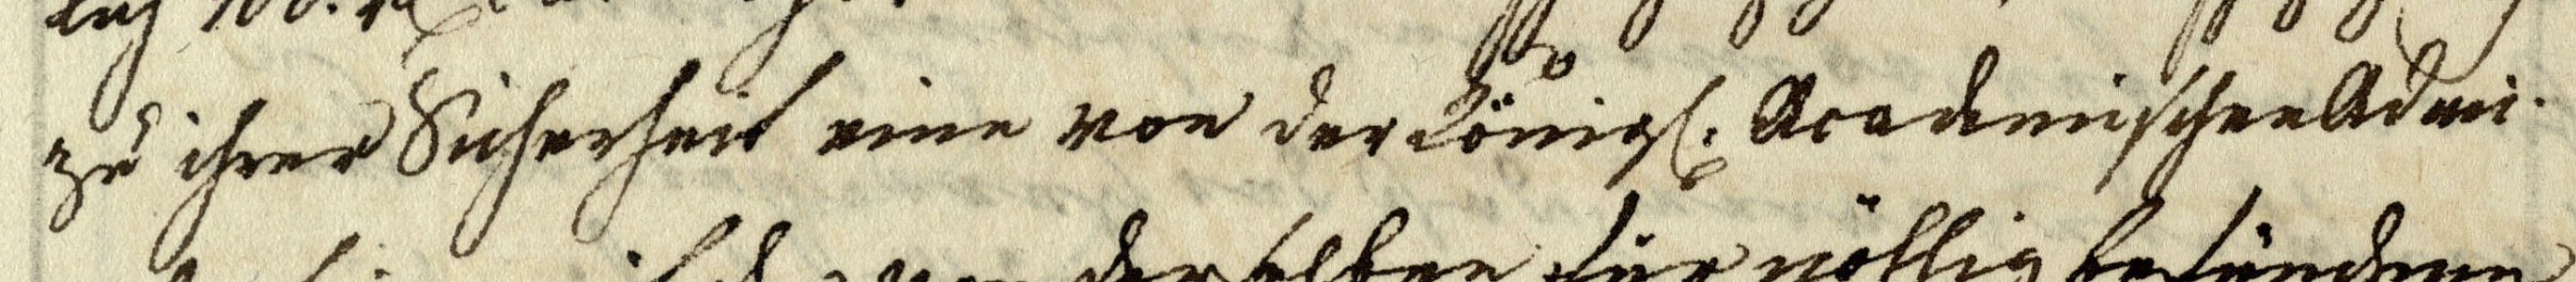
zu ihrer Sicherheit eine von der Königl: Academischen Admi
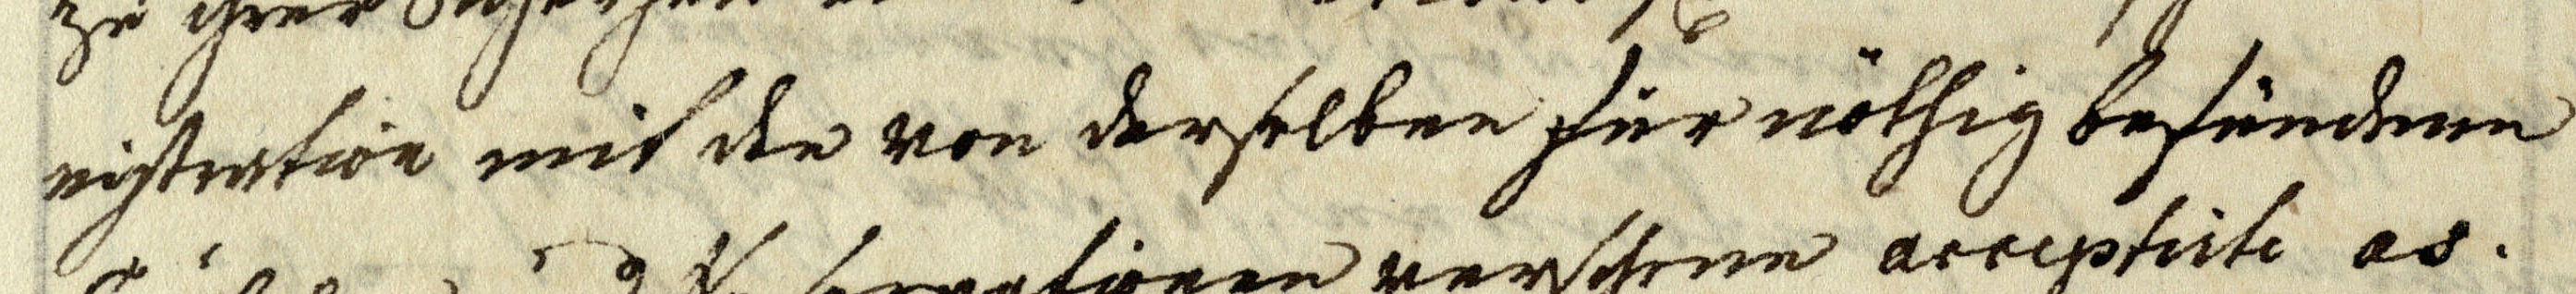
nistration mit der von derselben für nöthig befundene
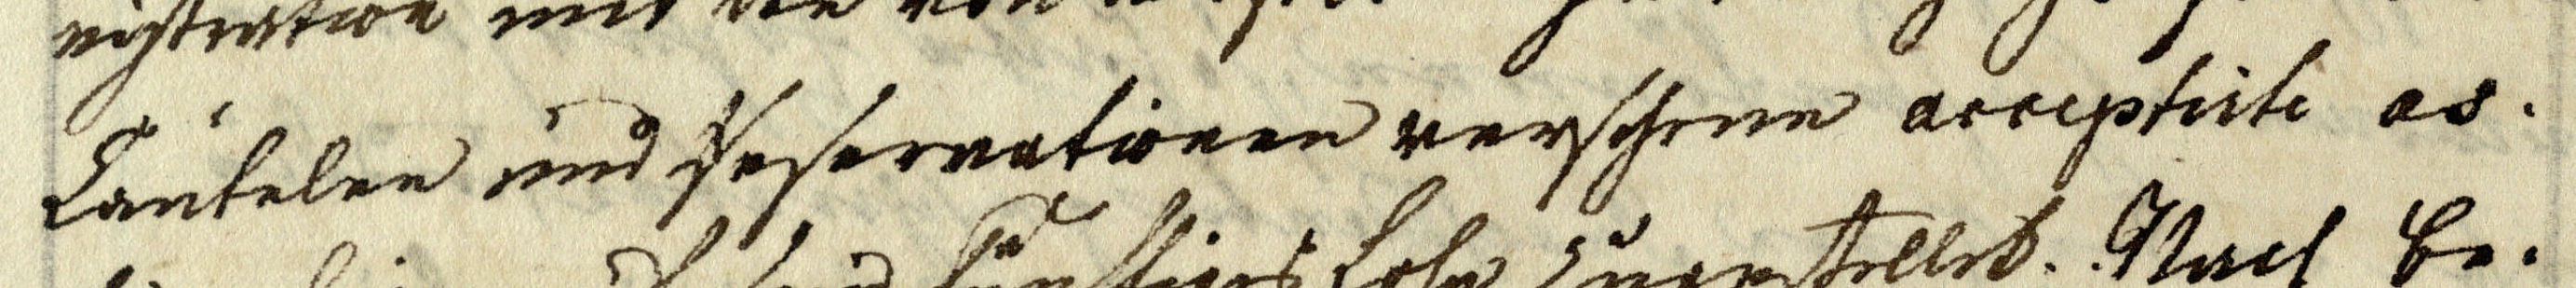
Lautelen und Reservationen verschone acceptirte as¬
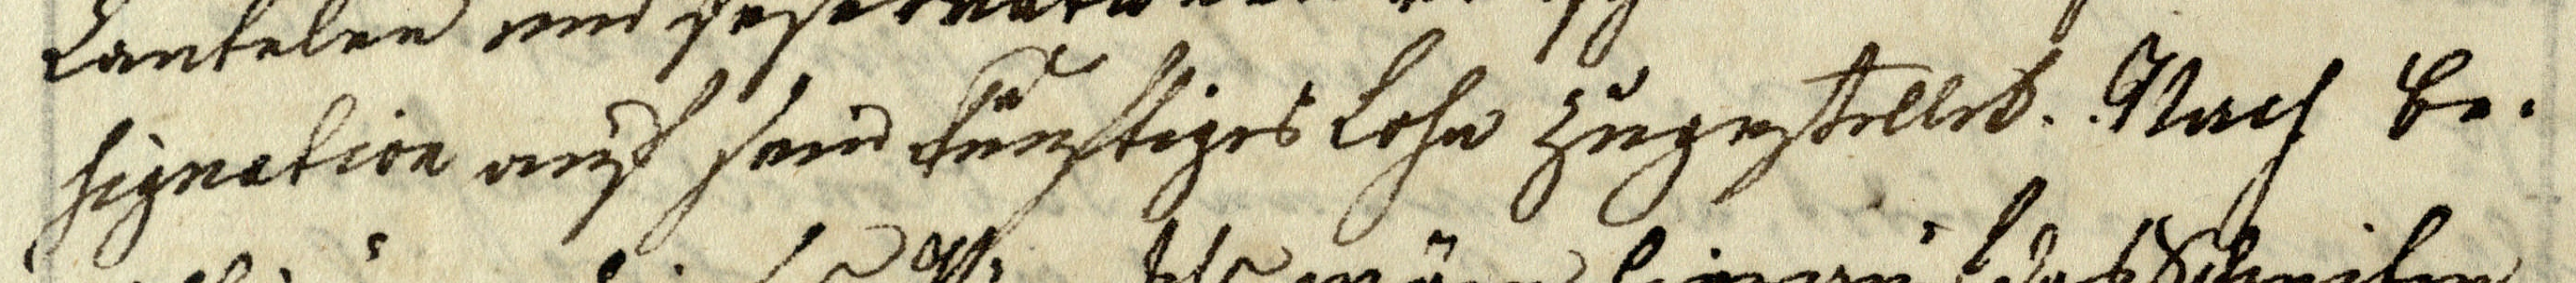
signation auf sein künftiges Lohn zugestellet. Nach Be¬
